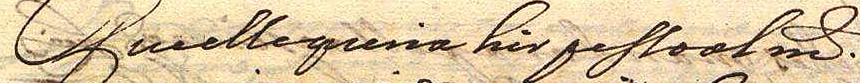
Que elle queria hir pessoalm.te
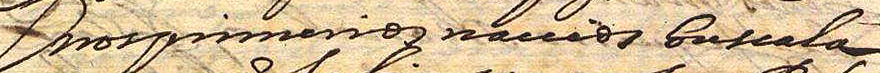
nos primeiros nauios buscala
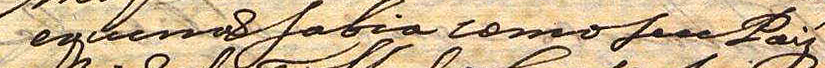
e que naõ sabia como seu Pay
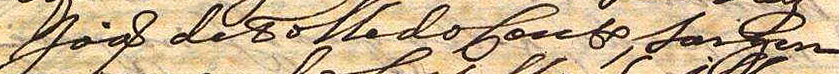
Joaõ de Tolledo Couto, sargen
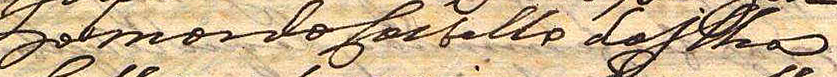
to mor do Castello da Jlha
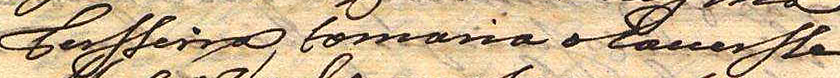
Tersseira, tomaria o hauersse
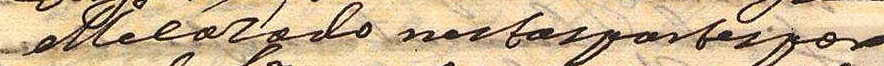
elle cazado nestas partes por
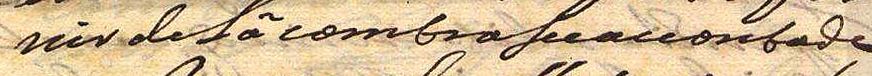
uir de lâ comtra sua uontade
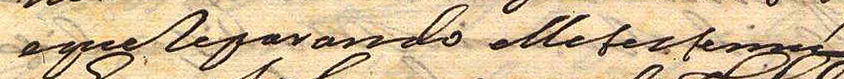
e que Reparando elle testemu
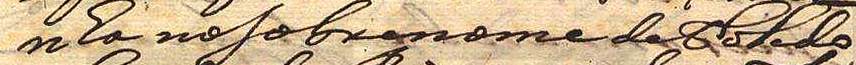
nha no sobrenome de Toledo
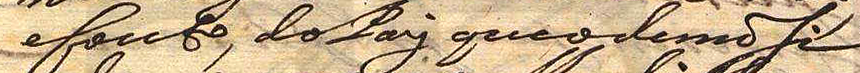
e Couto, do Pay que o denūsi
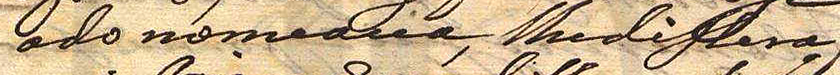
ado nomeaua lhe dissera
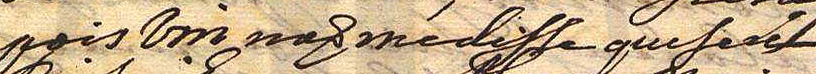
pois Vm naõ me disse que seu
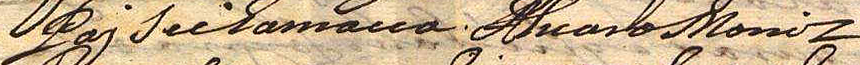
Pay se chamaua Aluaro Moniz
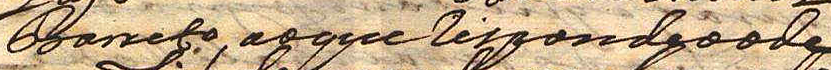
Barreto, ao que Respondeo o de
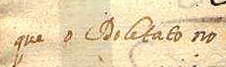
que o Deletato no
